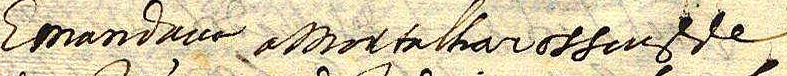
E mandaua amortalhar os seus de
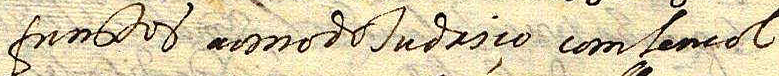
functos ao modo Iudaico com Lencol
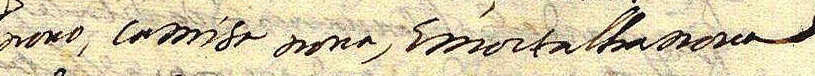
nouo, camisa noua, E mortalha noua
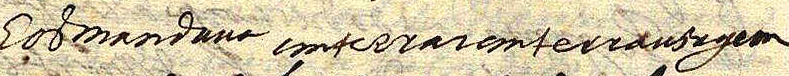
E os mandaua emterrar em terra uirgem
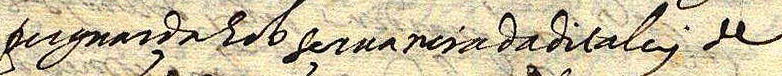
per guarda E obseruancia da dita ley de
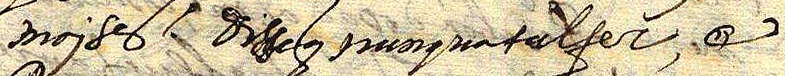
moyses? Disse q̄ nunqua tal fez, e
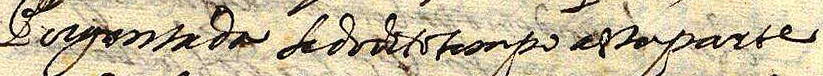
Perguntada se do dito tempo a esta parte
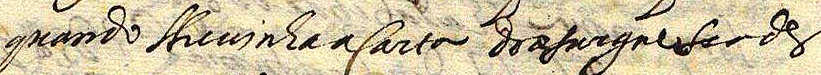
quando lhe uinha a Carta do asurgue se a des
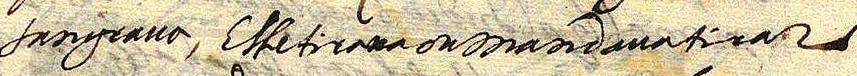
sangraua, E lhe tiraua ou mandaua tirar
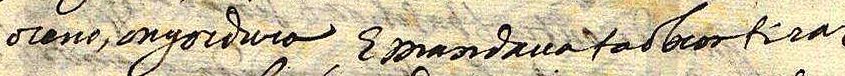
o ceuo, ou gordura E mandaua taõbem tirar
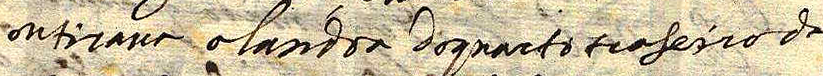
ou tiraua a landoa do quarto traseiro da
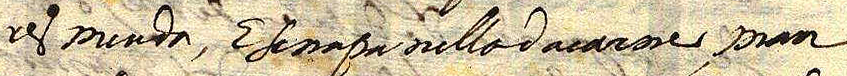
res meuda, E se na panella da carne, man
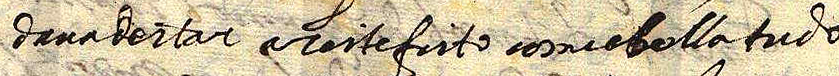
daua deitar azeite frito com cebolla tudo
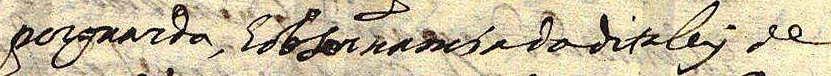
per guarda, E obseruancia da dita ley de
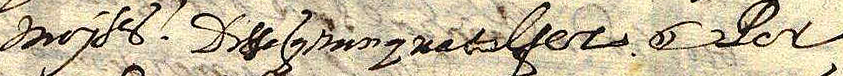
moyses? Disse q̄ nunqua tal fez ⁋ Per
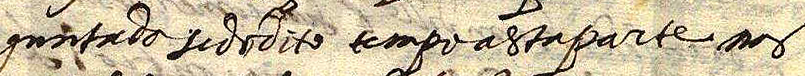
guntada se do dito tempo a esta parte nas
